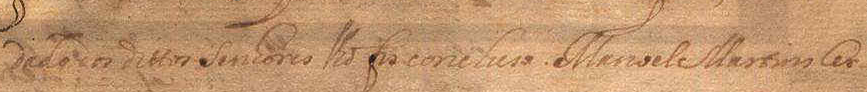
dado dos dittos Senhores lho fis concluso. Manoel Martins Cer
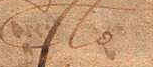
Clo
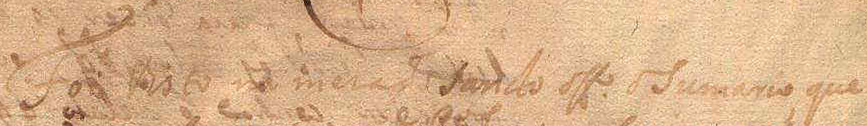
Foi visto na meza do sancto offo o Sumario que
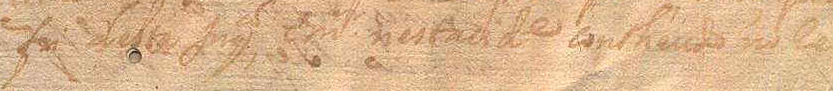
foi desta Jnqçō, e mor. nesta cide contheudo no Re
